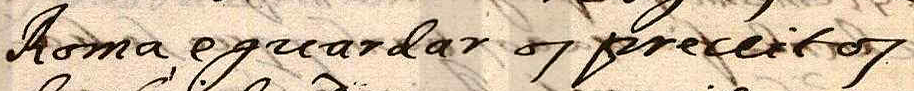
Roma, e guardar os preceitos
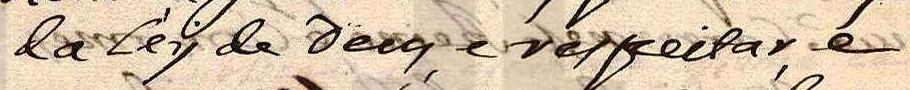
da Ley de deus, e respeitar, e
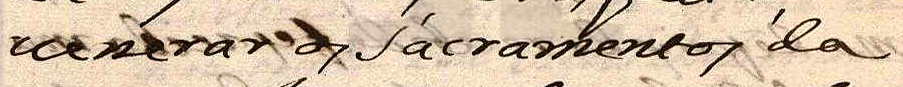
uenerar os sacramentos da
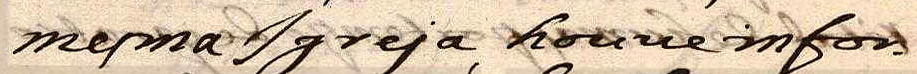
mesma Jgreja, houue infor
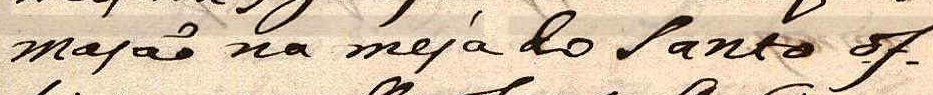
masaõ na mesa do Santo of
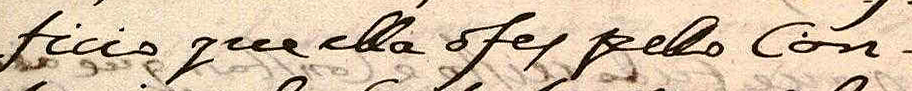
ficio que ella o fes pello Con
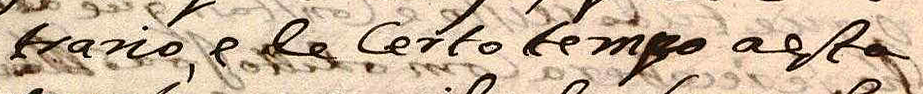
trario, e de certo tempo a esta
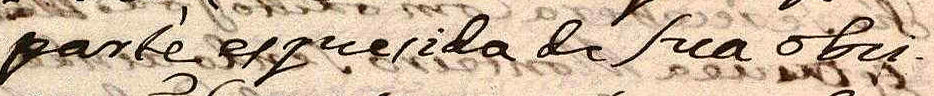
parte esquesida de sua obri
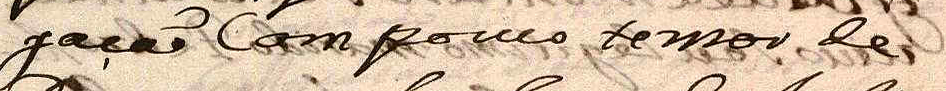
gaçaõ Com pouco temor de
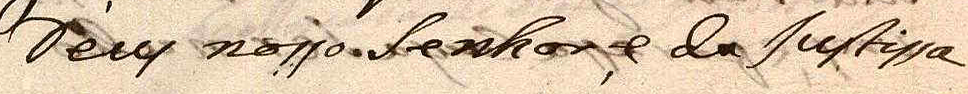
Deus nosso senhor, e da Justissa
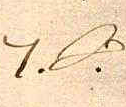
7. tr.
